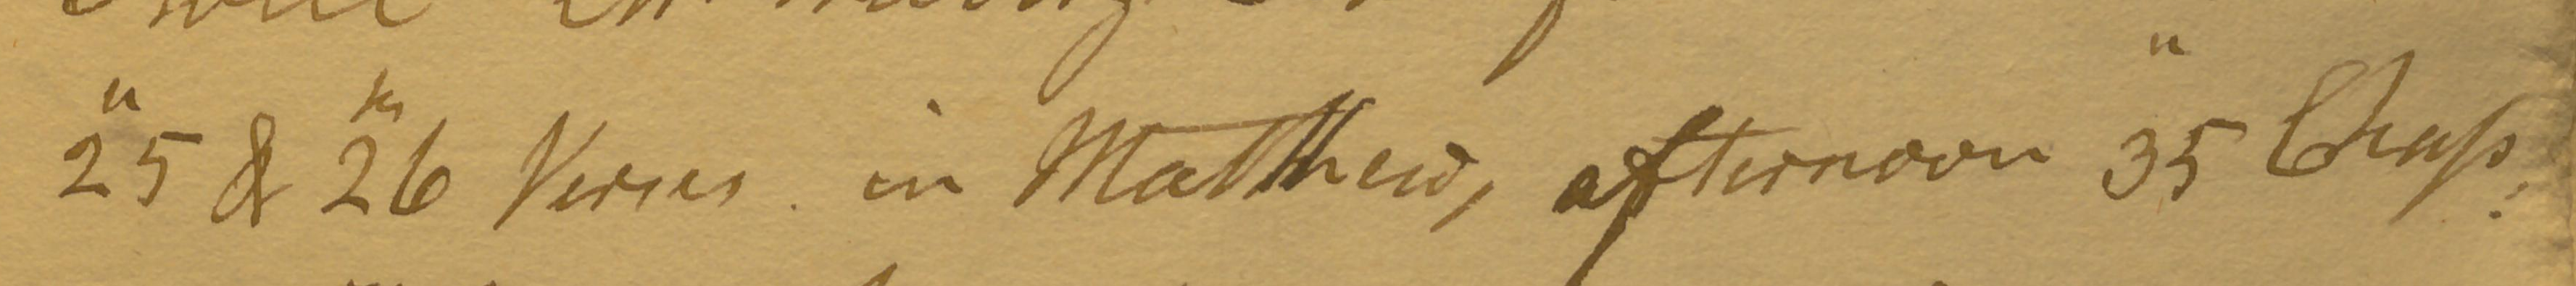25^th & 26^th Verses in Matthew, afternoon 35 Chap.
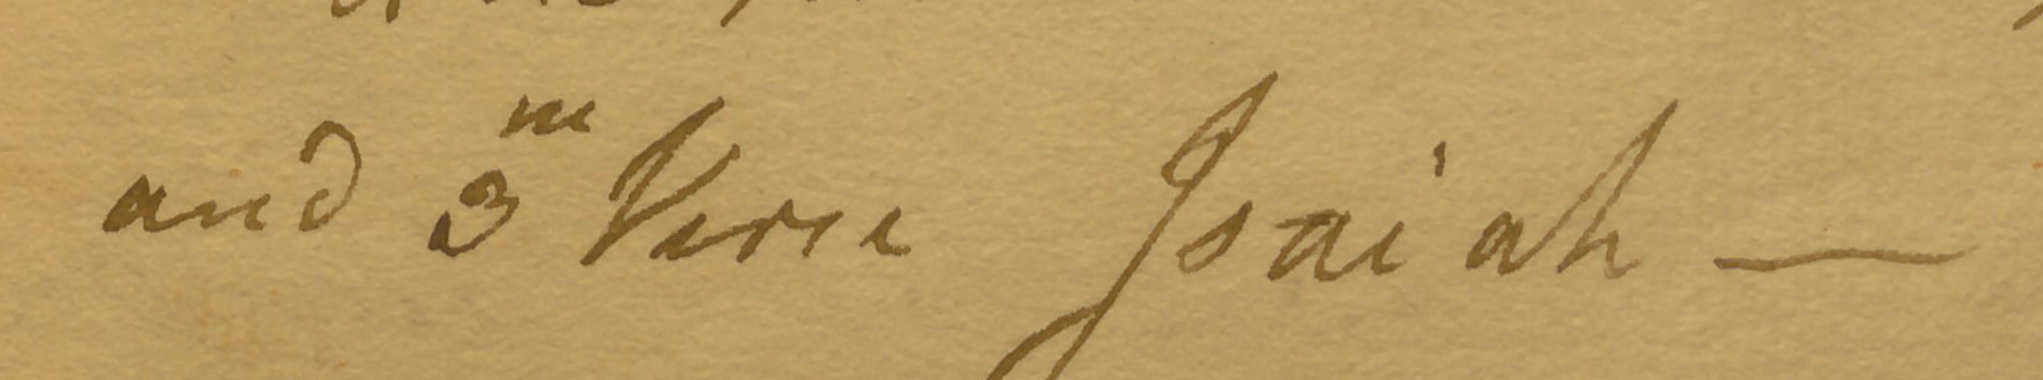and 3^th Verse Isaiah-
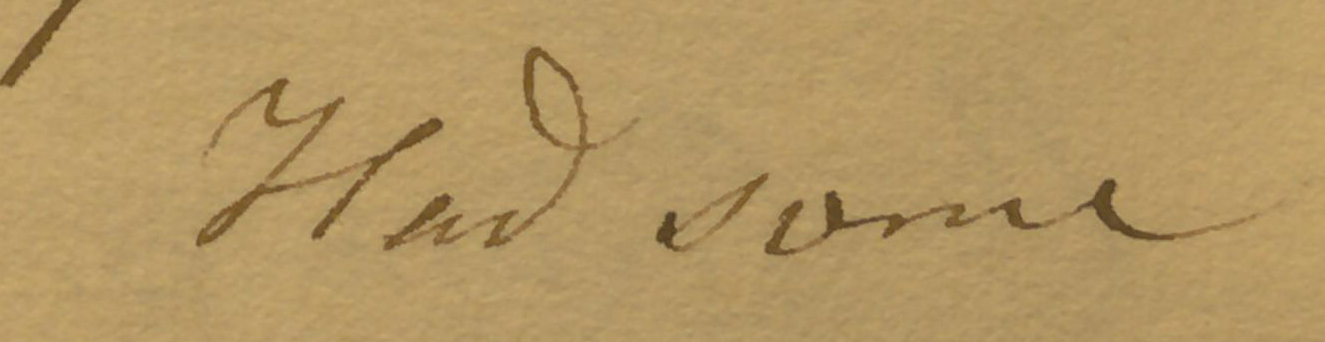Had some
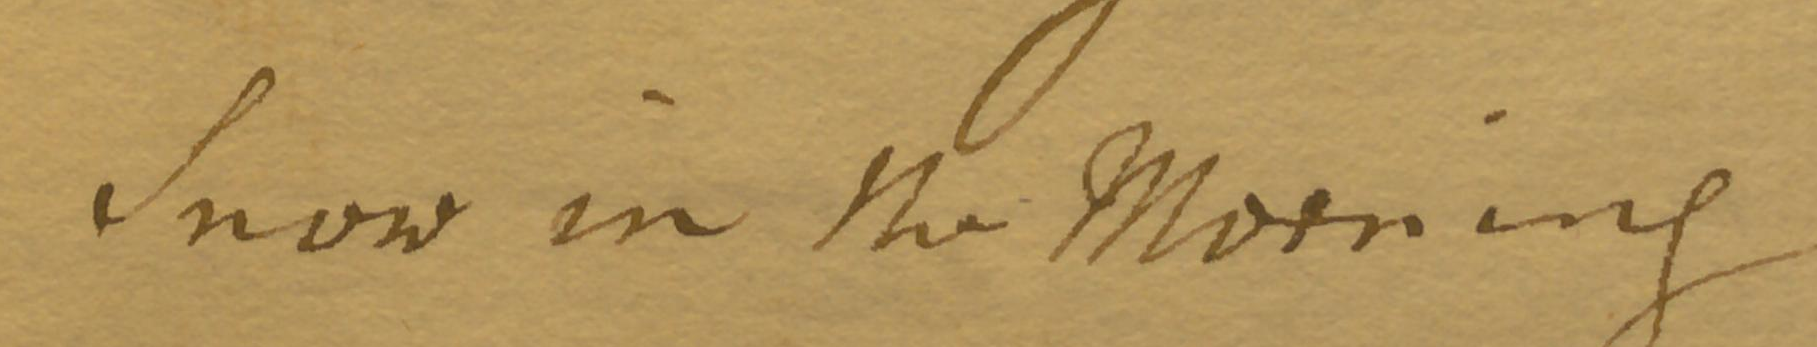snow in the Morning
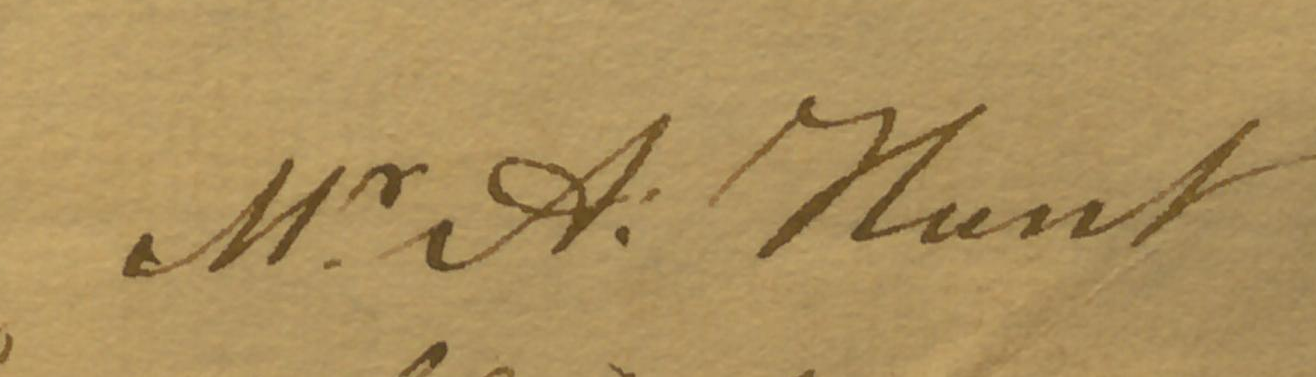M^r. A. Hunt
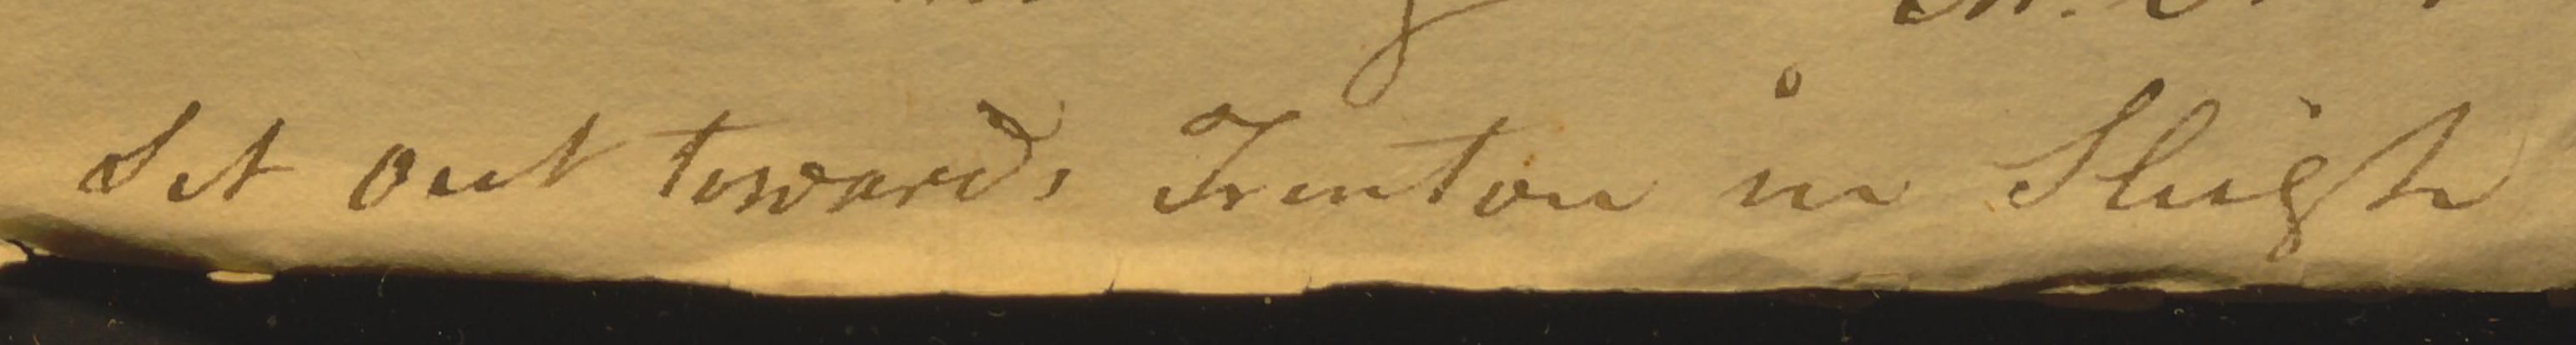set out teward. Trenton in Sleigh
